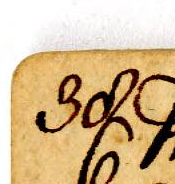38
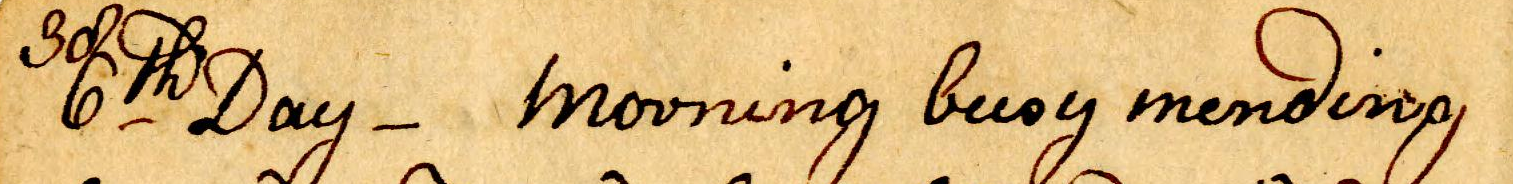6^th Day- Morning busy mending
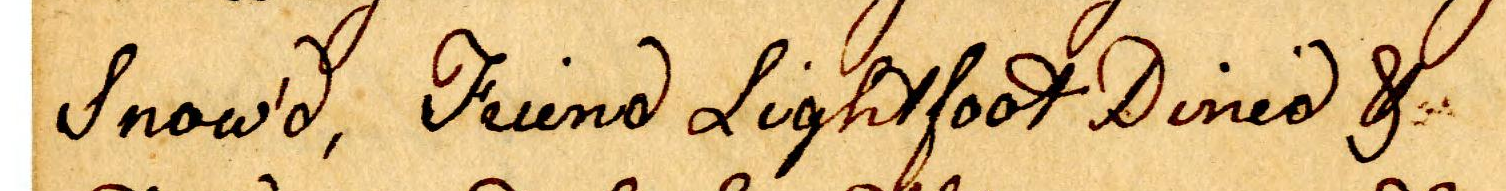Snow'd, Friend Lightfoot Dined &
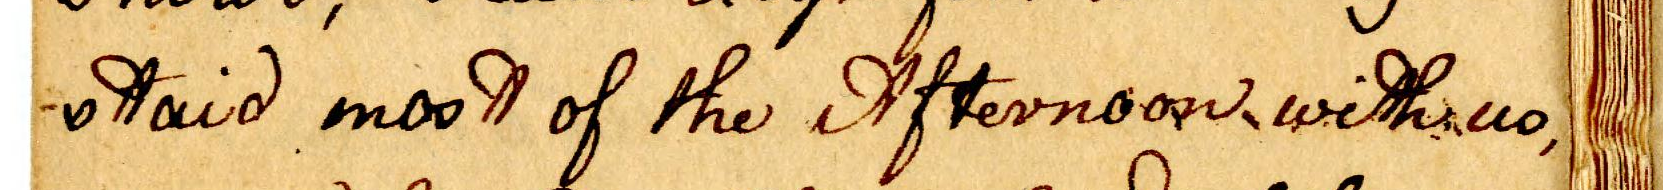staid most of the Afternoon with us
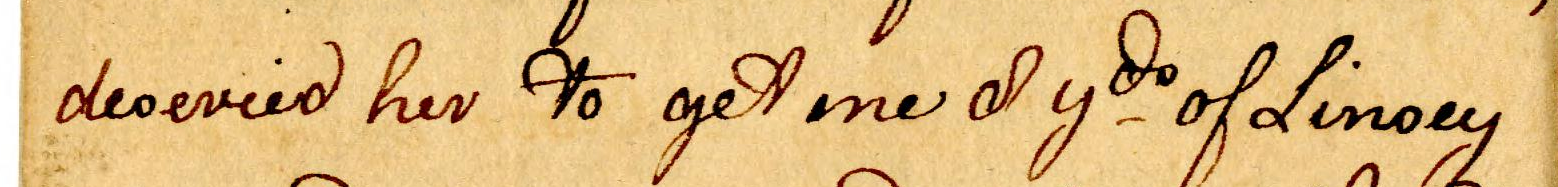deseried her to get me 8 y^ds of Linsey
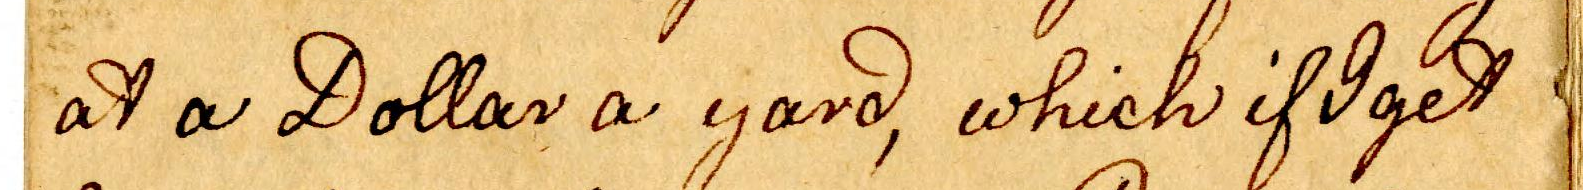at a Dollar a yard, which if I get
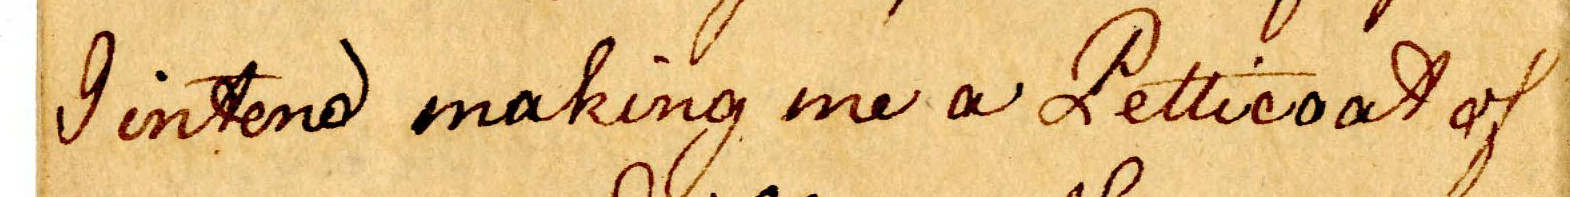I intend making me a Petticoat of
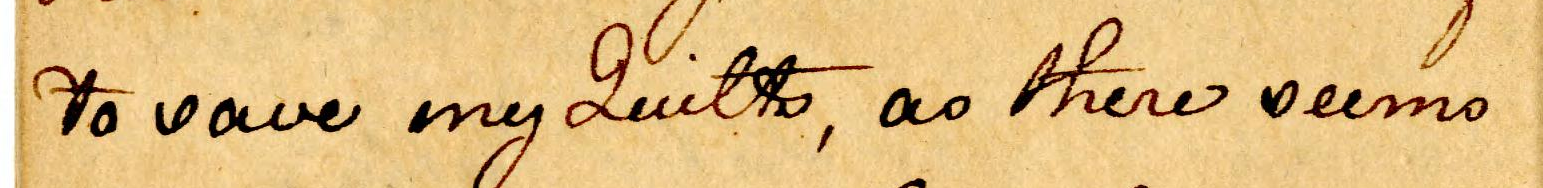to save my Quilts, as there seems
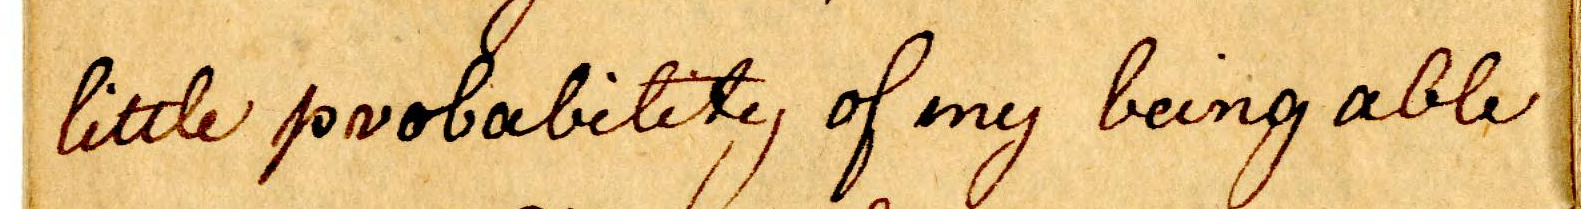little probability of my being able
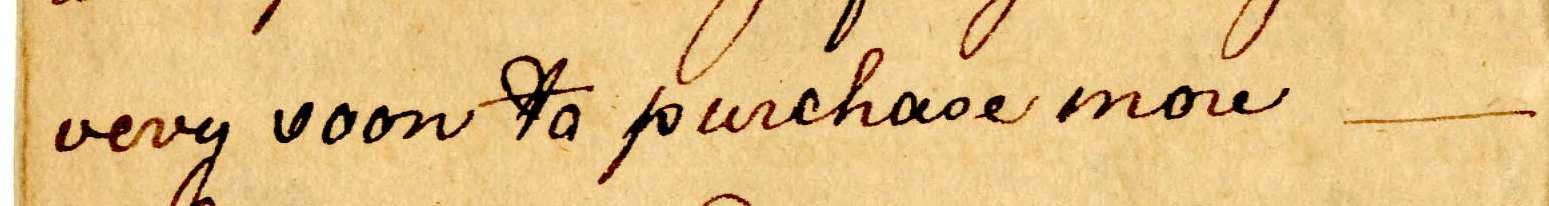very soon to purchase more-
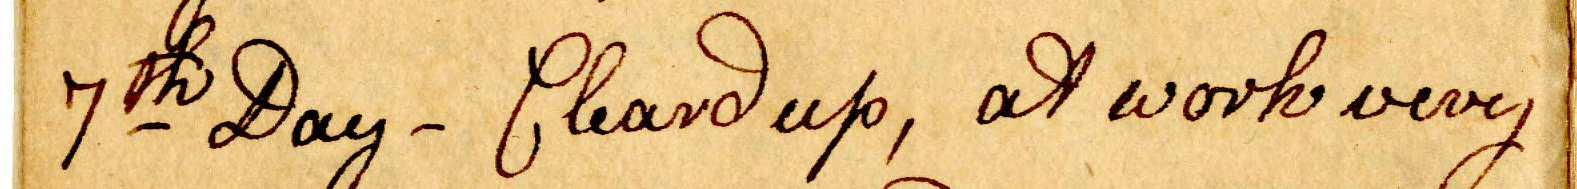7^th Day- Cleard up, at work very
